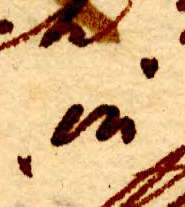in
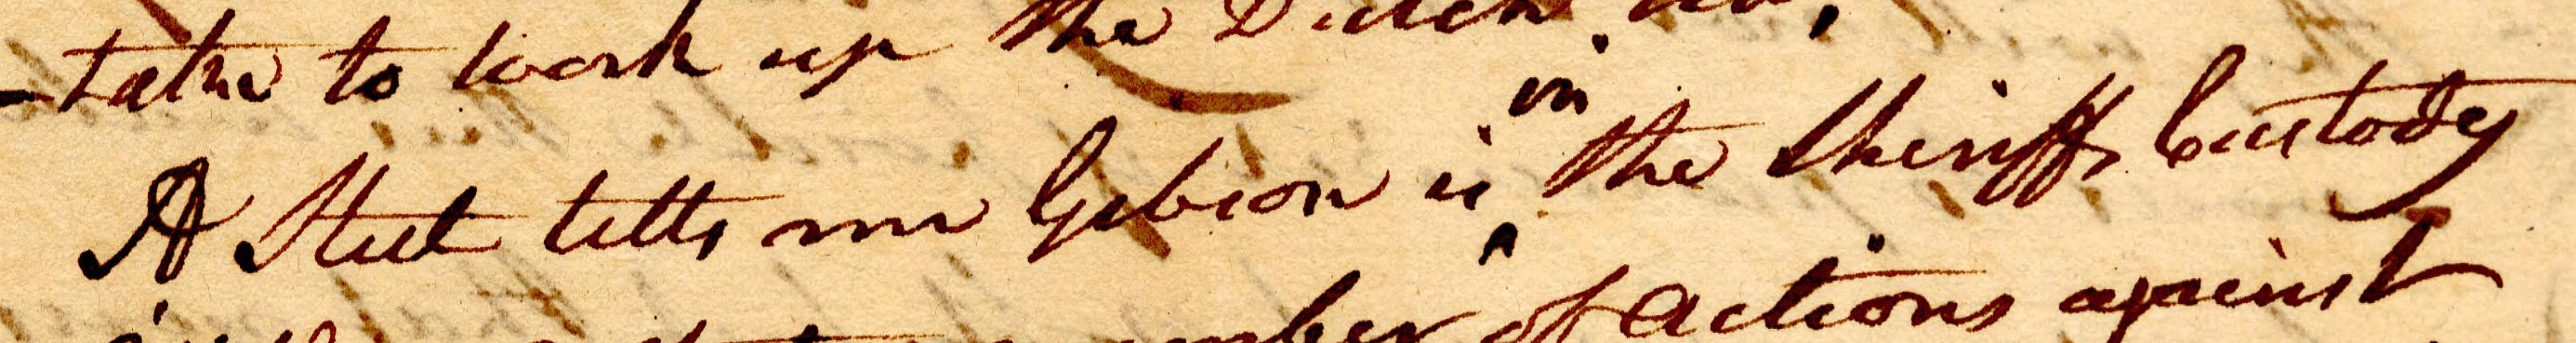A stul tells me Gibson is ^ the sheriffs, Custody
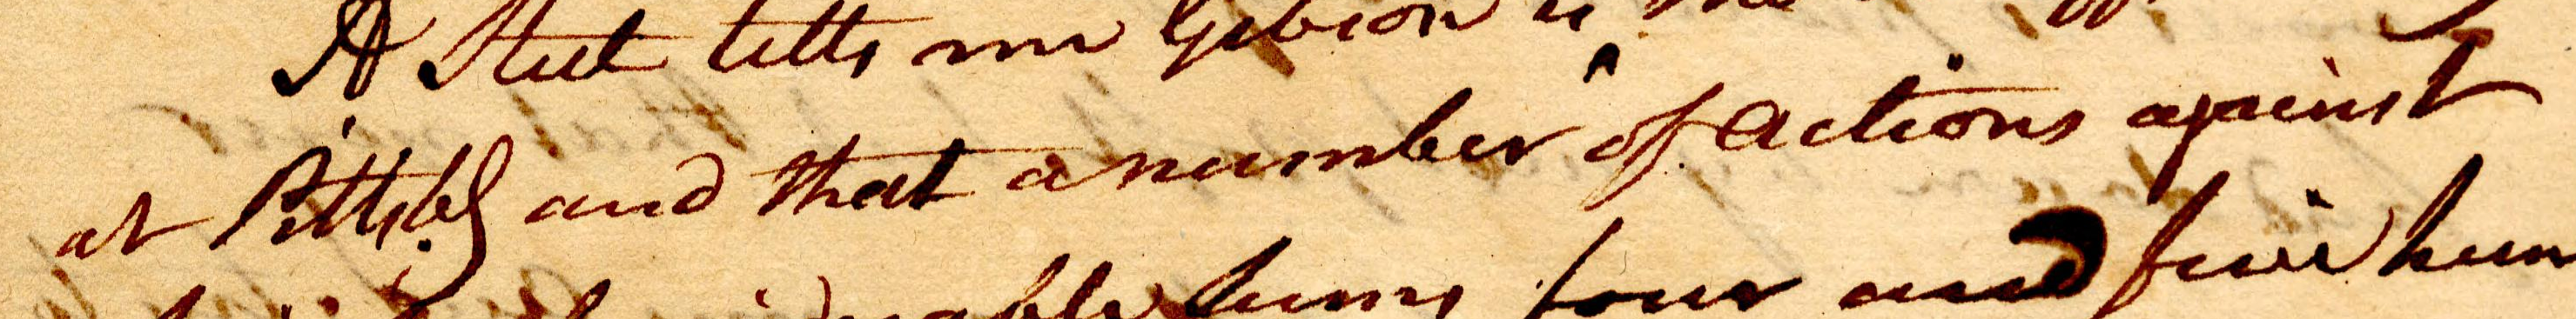at Pittsb^g and that a number of Actions against
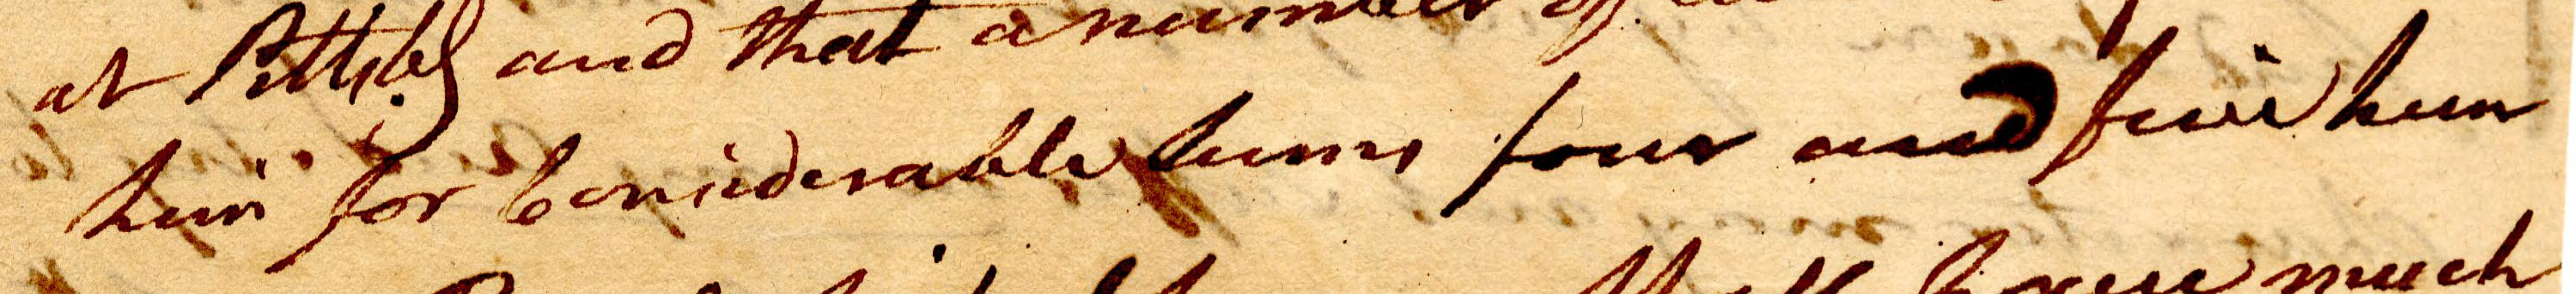him for Considerable sums four and five hun-
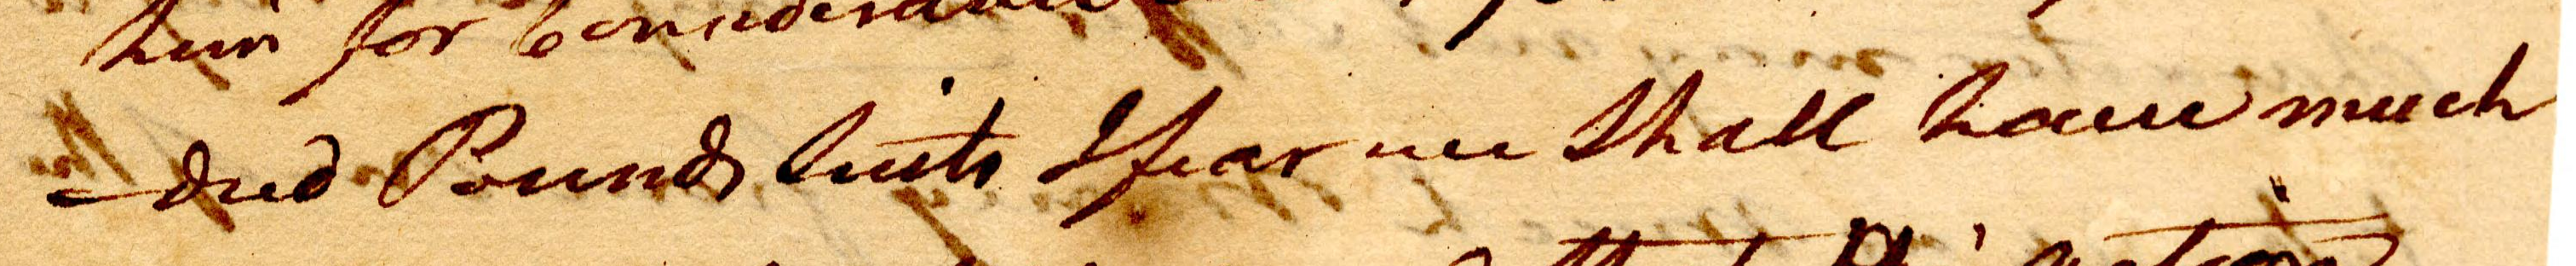-dred Pounds suits I fear we shall have much
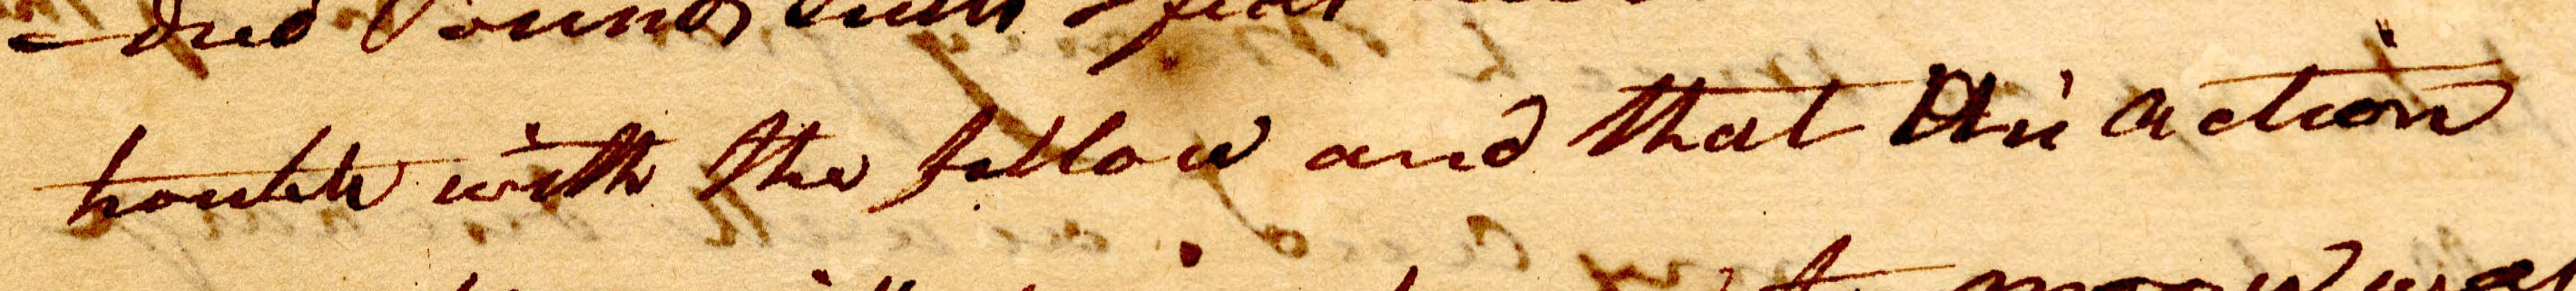trouble with the fellow and that this Action
